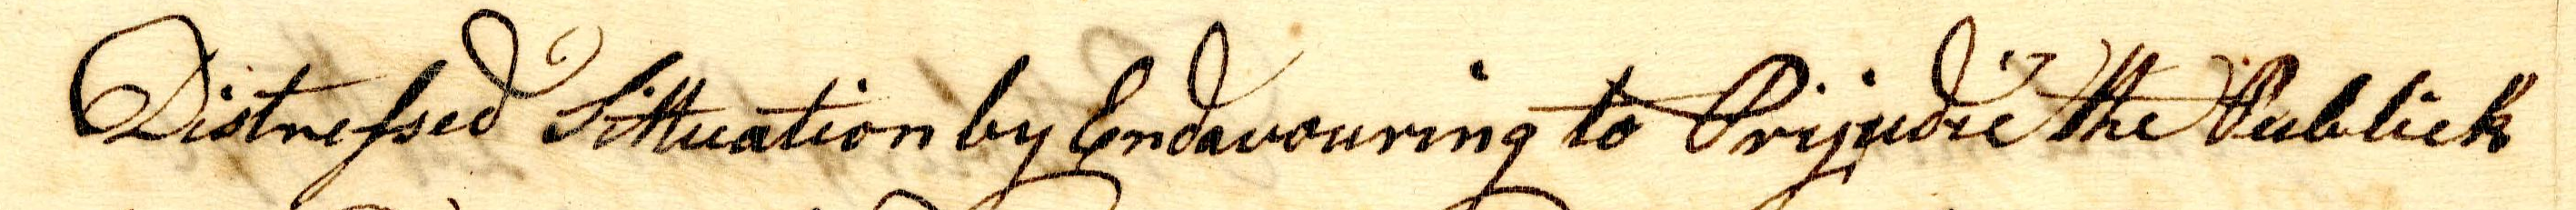Distressed Situation by Endeavouring to Prejudic the Publick
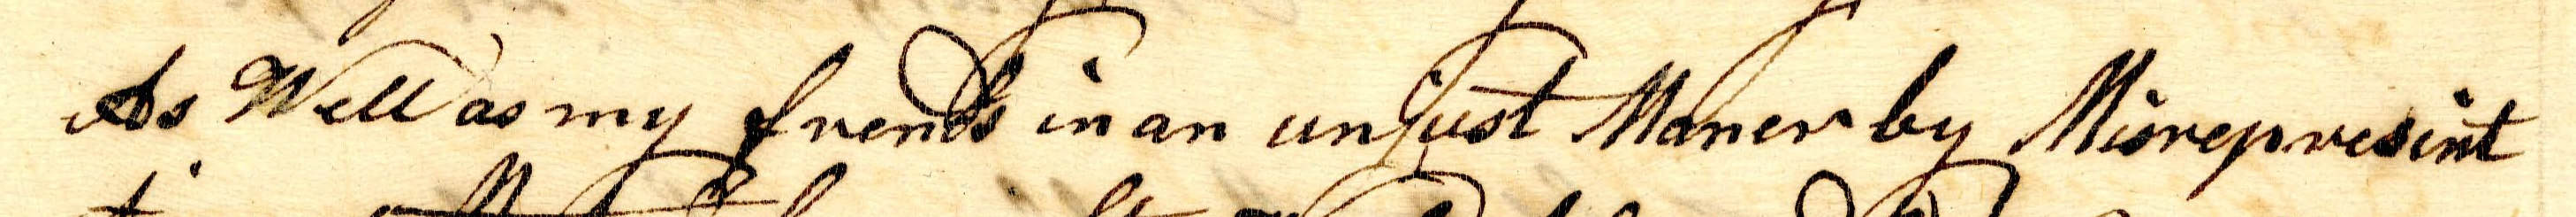As Well as my frends in an unjust Maner by Misrepresent
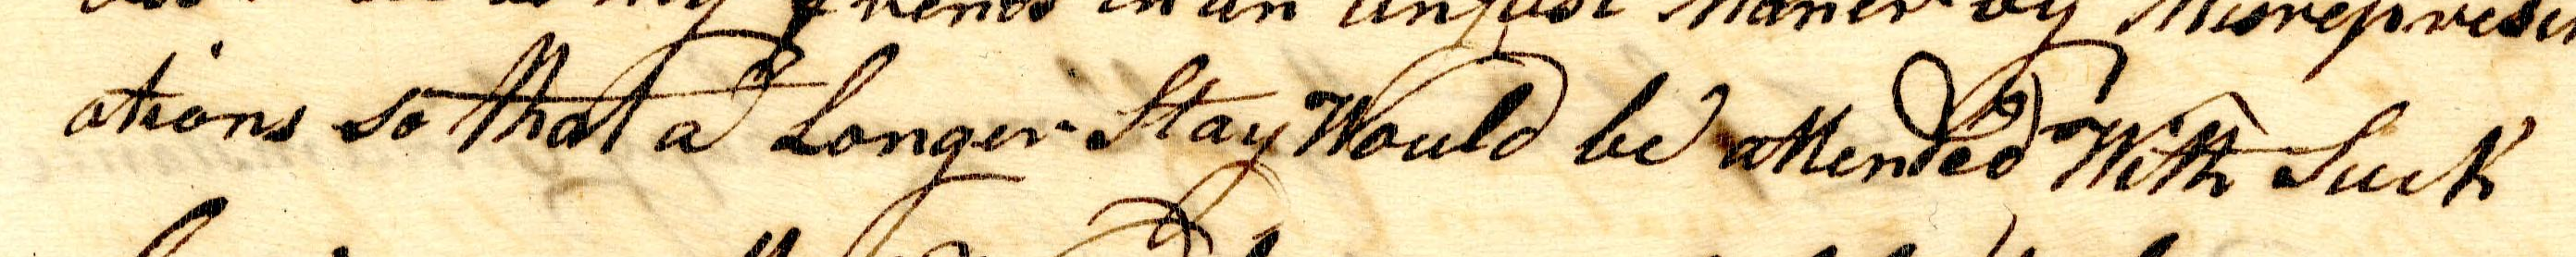ations so that a Longer Stay would be attended With Such
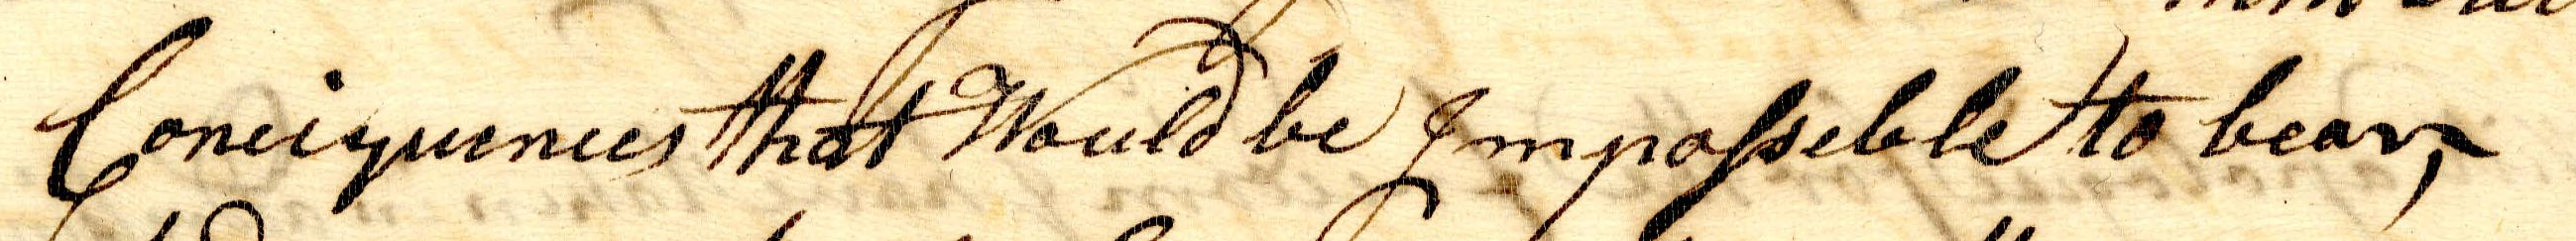Conciquences that Would be Impossible to bear,
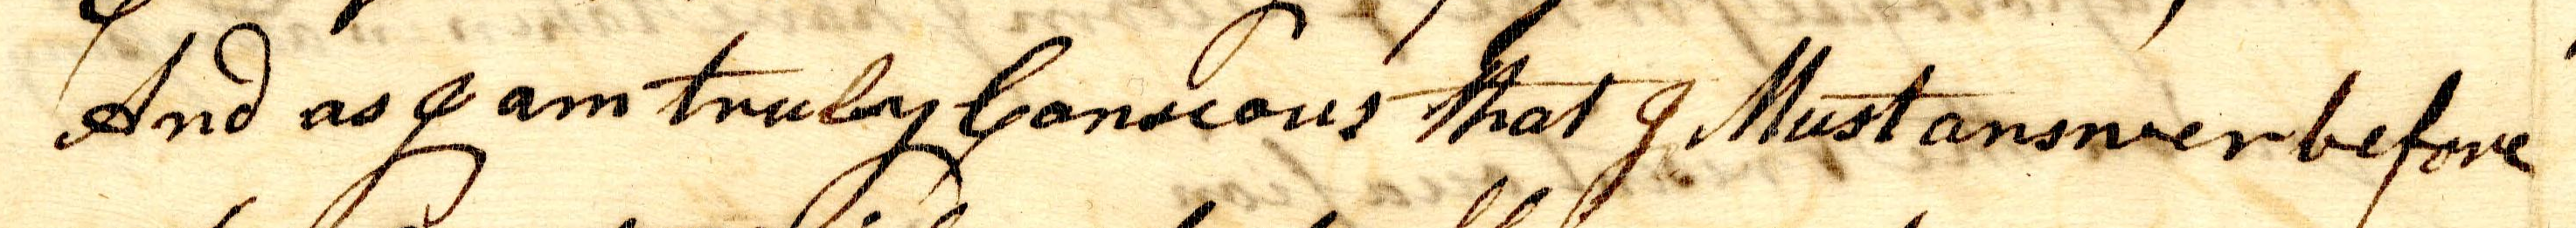And as I am truly Conscious that I Must answer before
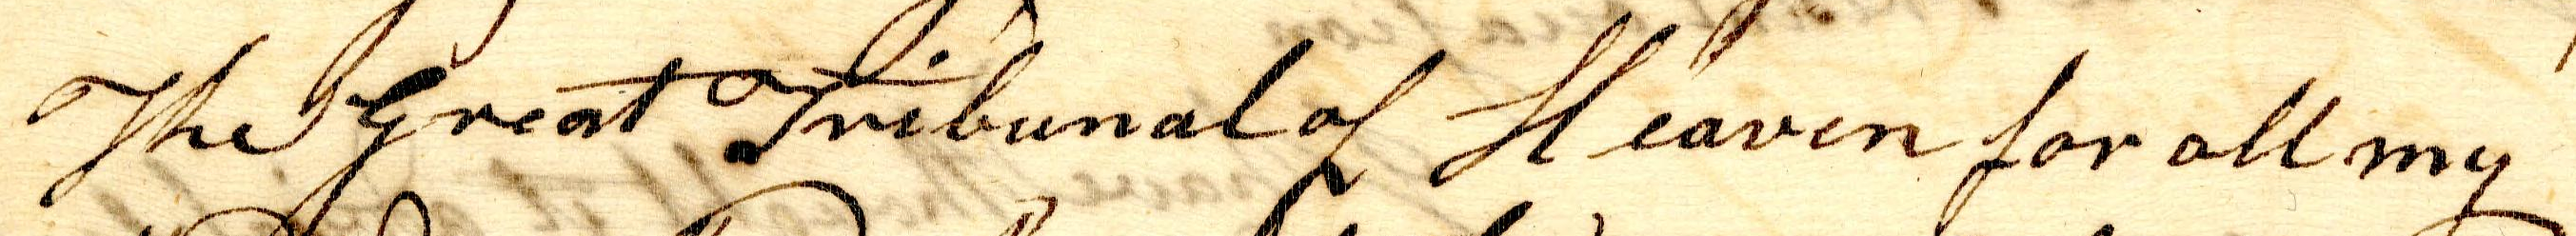The Great Tribunal of Heaven for all my
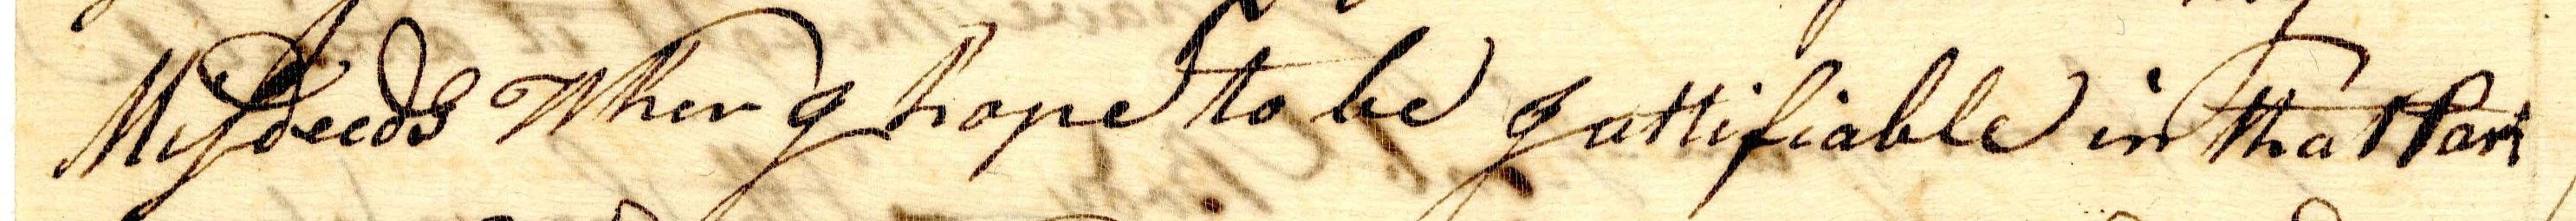Misdeeds Wher I hope to be justifiable in that Part
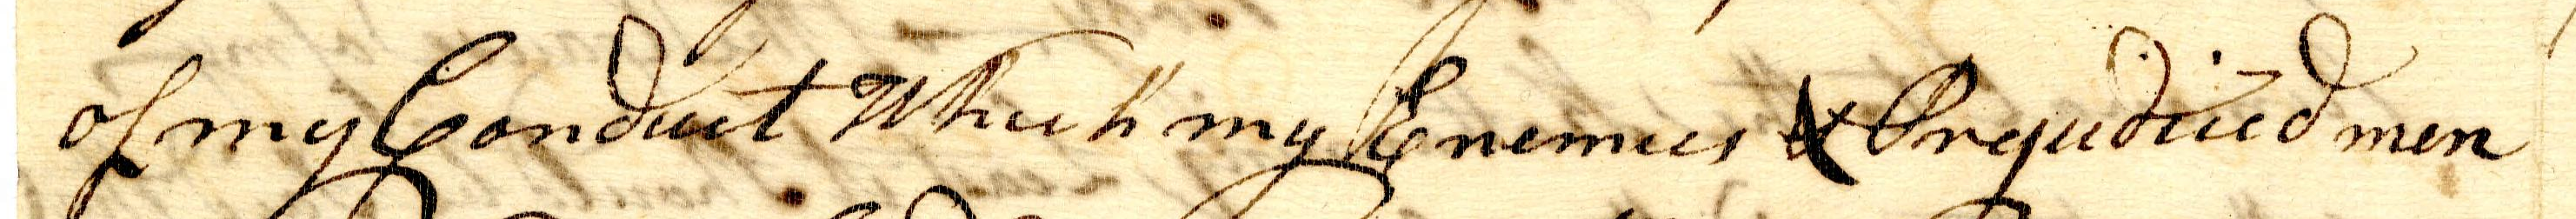of my Conduct Which my Enemies & Prejudiced men
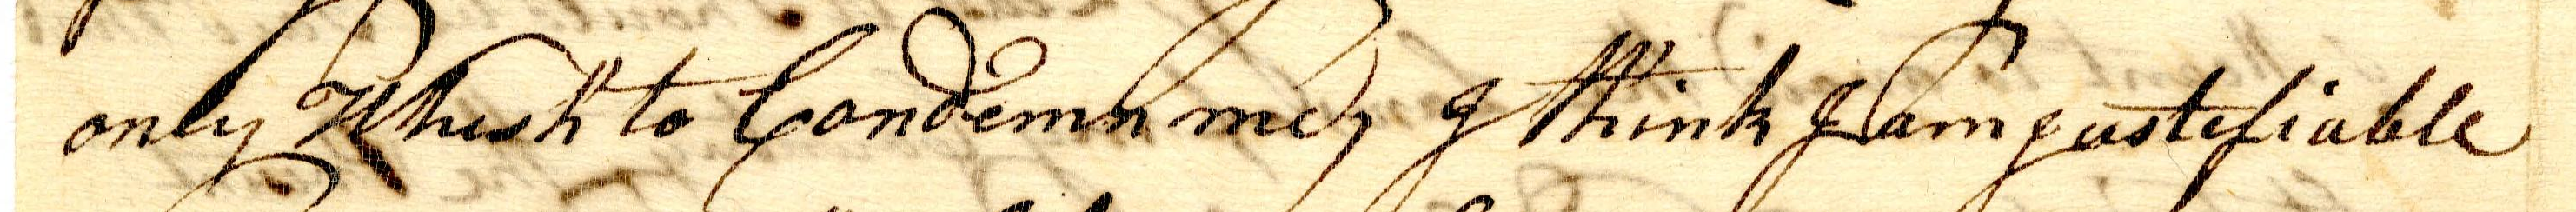only Whish to Condemn may I think I am justifiable
